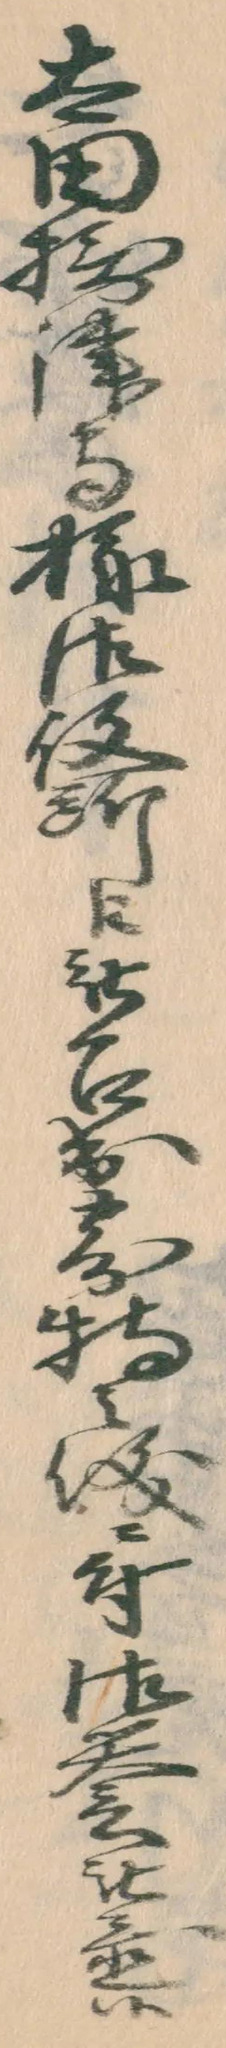太田摂津守様御役所え被召出奇特之儀ニ付御誉被置候

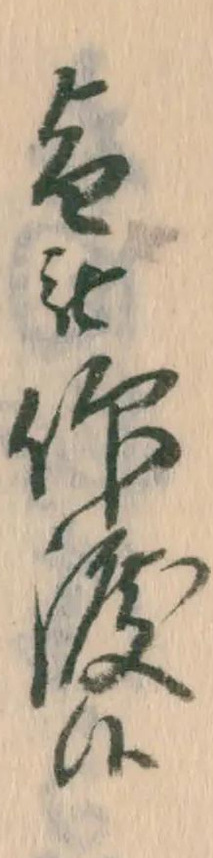旨被仰渡候
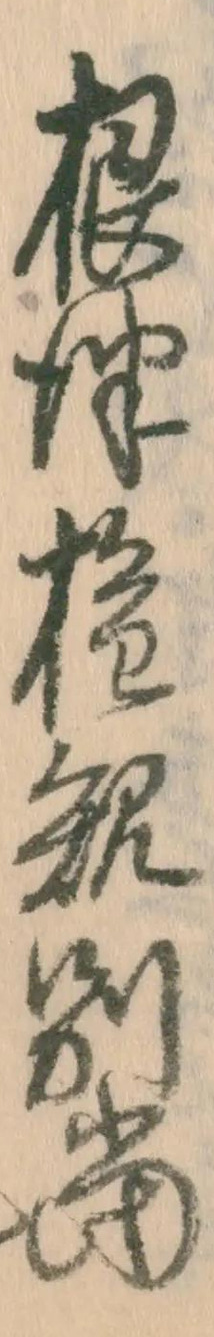根津権現別当
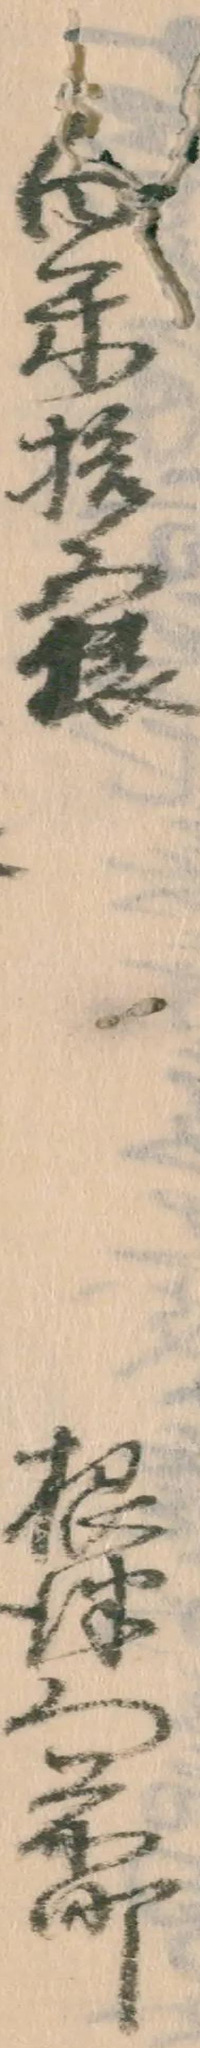白米拾五俵根津門前町
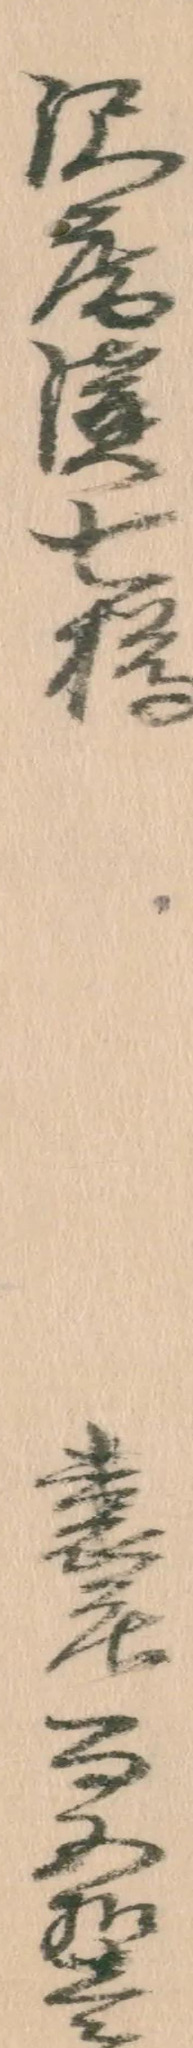沢庵漬七樽裏店百五拾壱軒
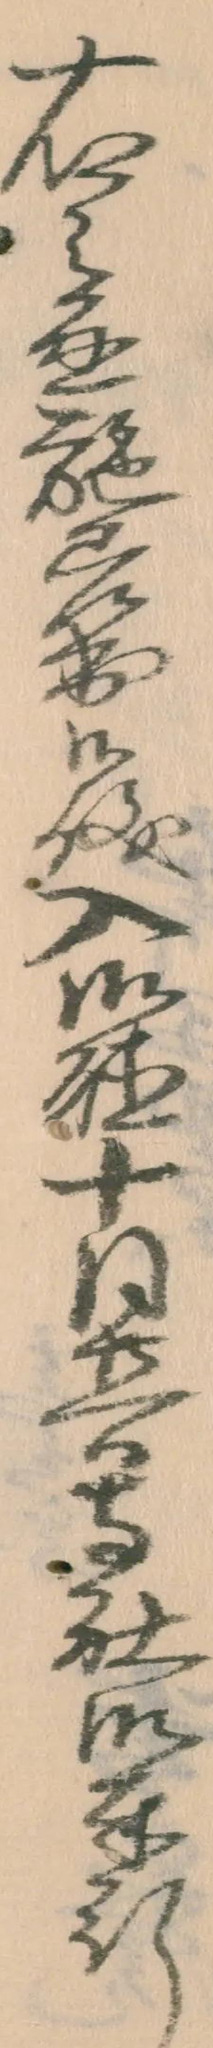右之通施差出候儀入御聴十月廿一日寺社御奉行
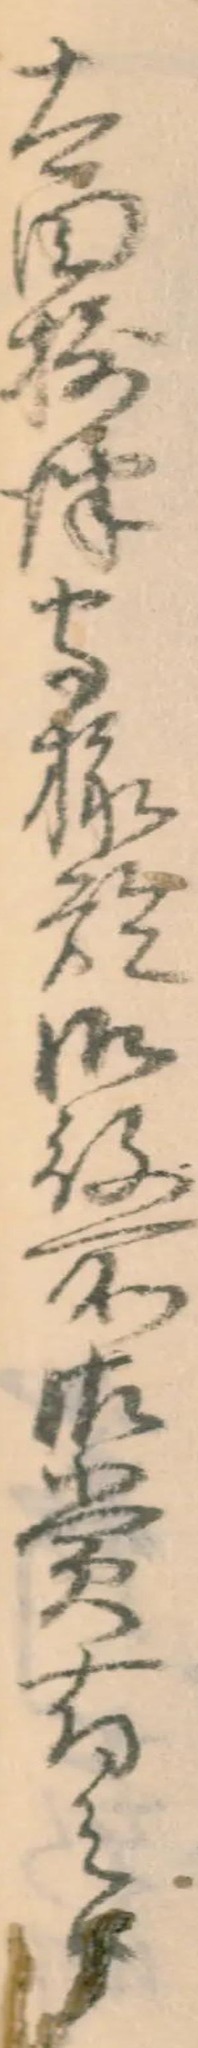太田摂津守様於御役所御賞有之候
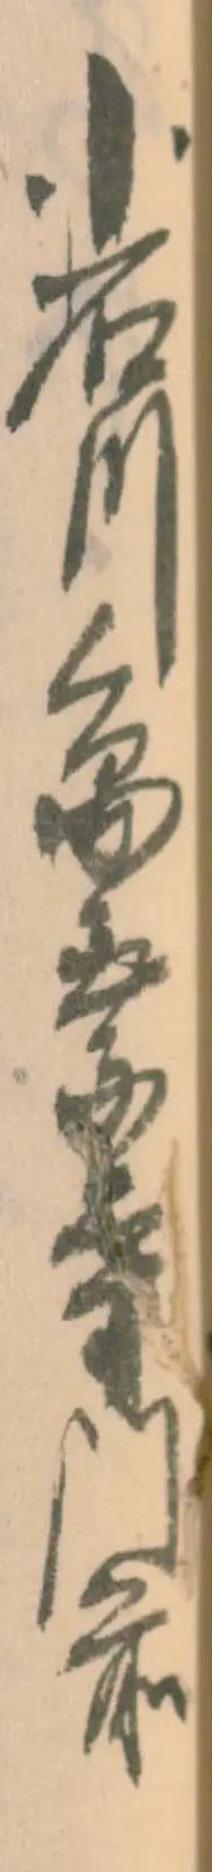小石川円乗寺門前
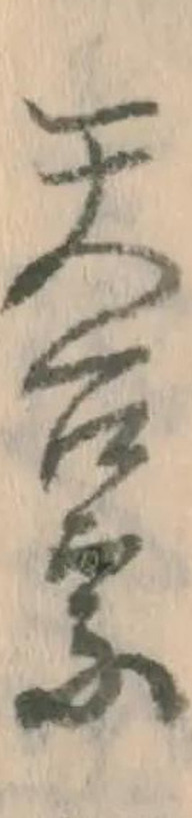天台宗
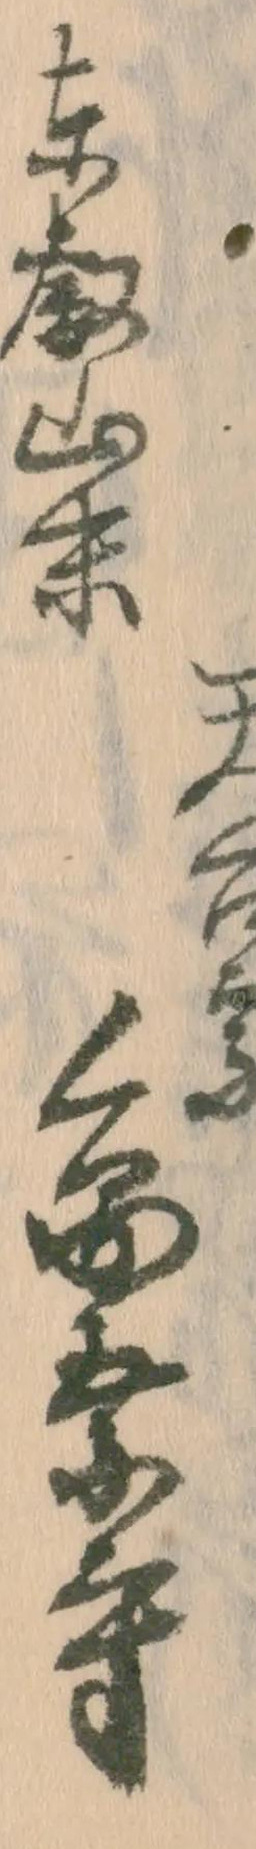東叡山末円乗寺
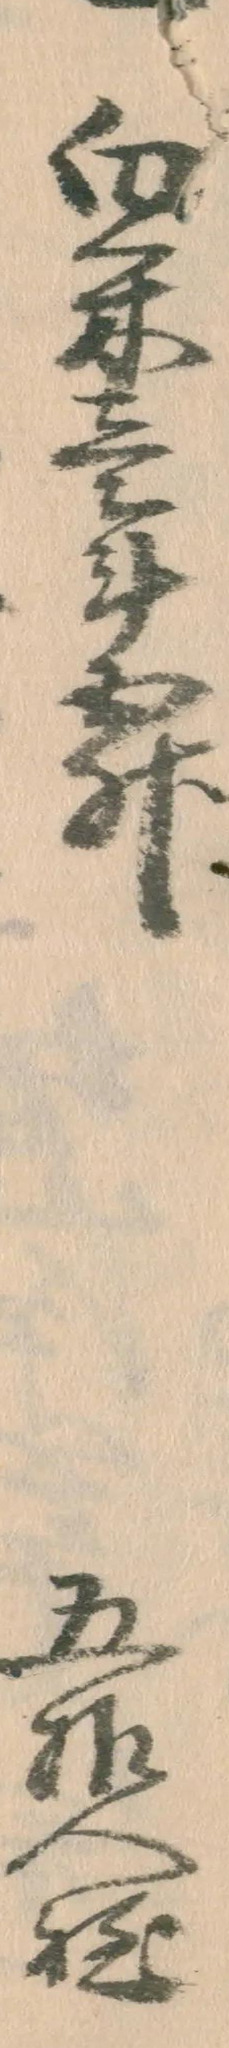一白米壱斗五升五拾人程
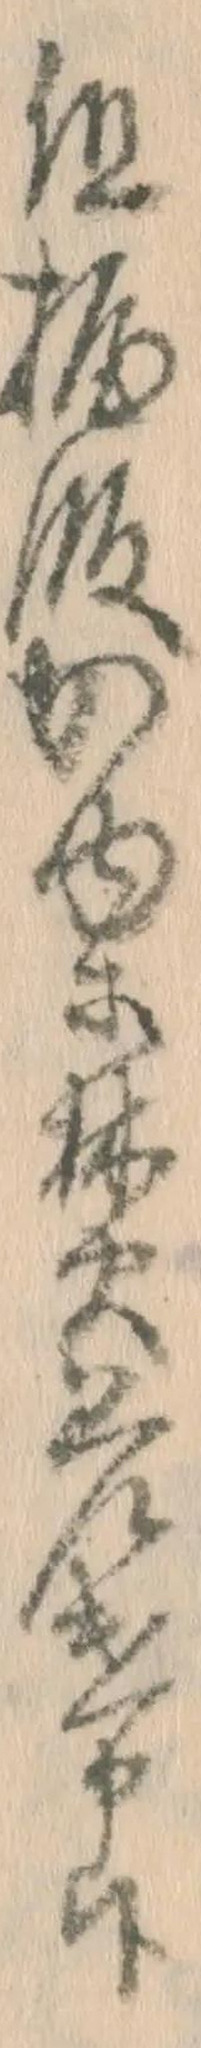但握飯かゆ等焚差遣申候
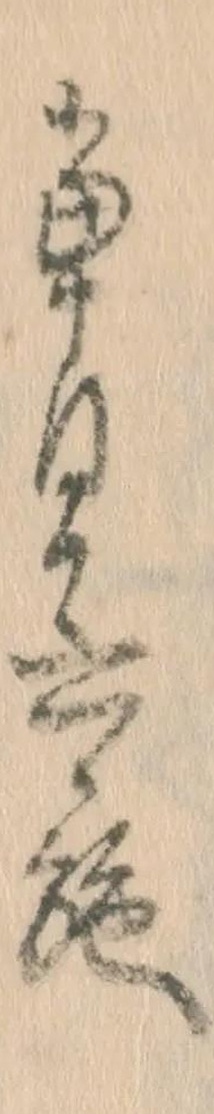当十月六日施右

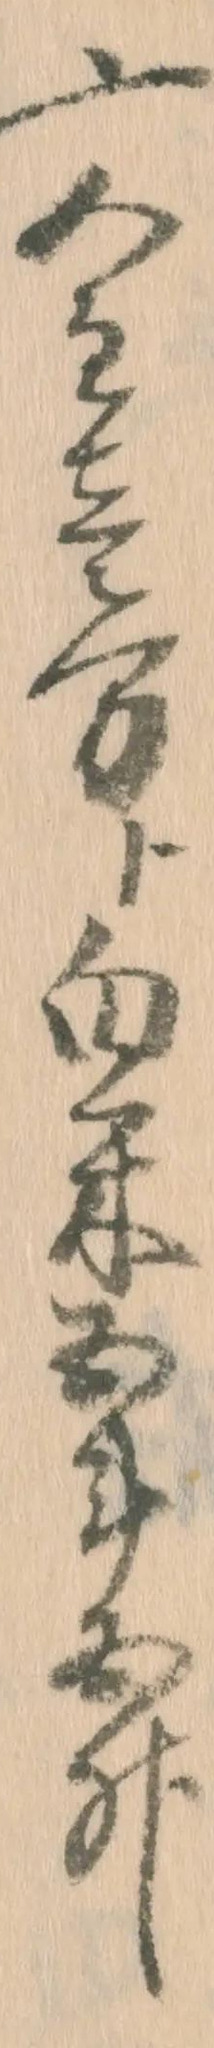〆金壱分ト白米五斗五升
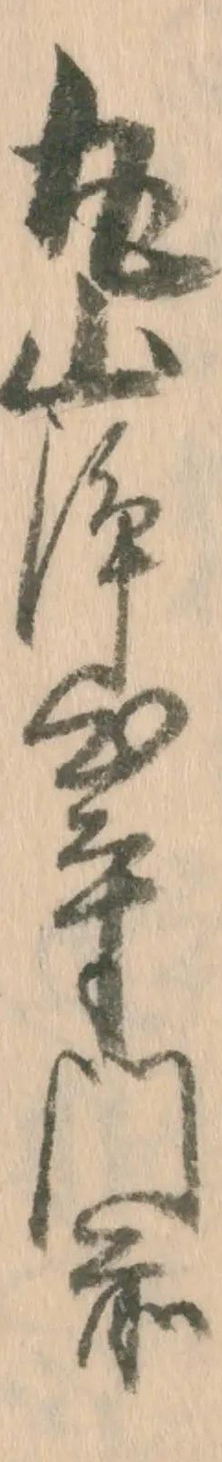丸山浄心寺門前
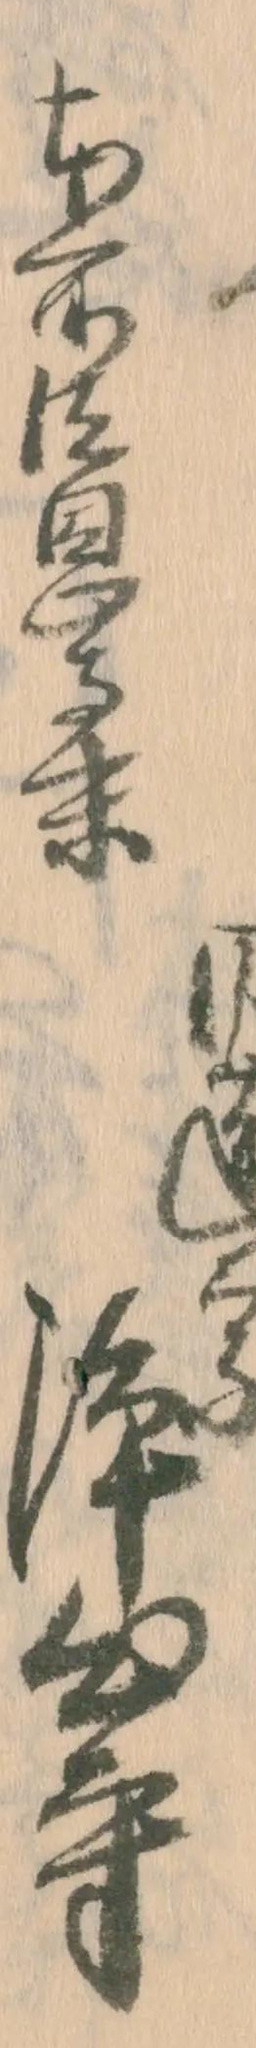本所法恩寺末浄心寺
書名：武家方并寺院等ニテ施差出候一件
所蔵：国立国会図書館 National Diet Library, JAPAN
